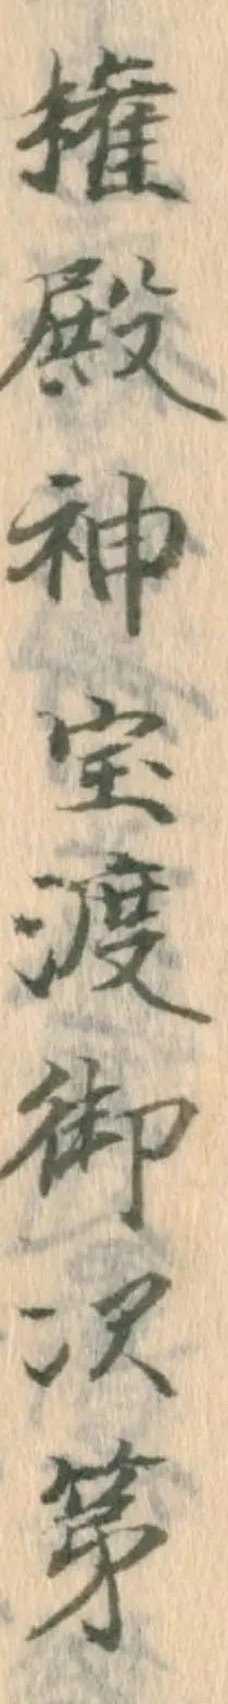権殿神宝渡御次第
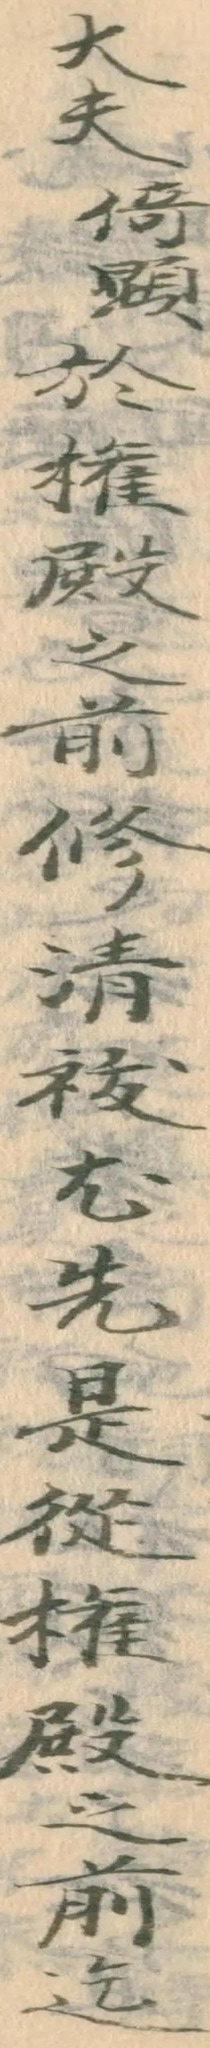大夫倚顕於権殿之前修ノ清祓尤先是従権殿之前迄

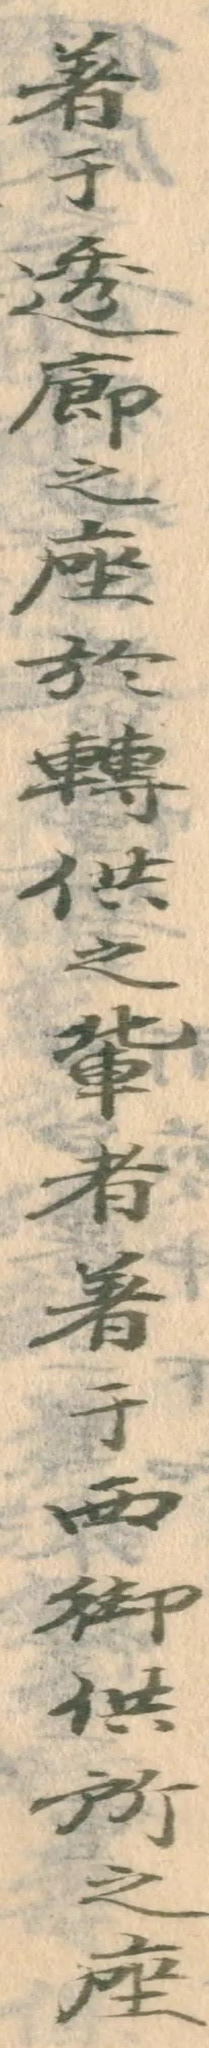着于透廊之座於転供之輩は着于西御供所之座
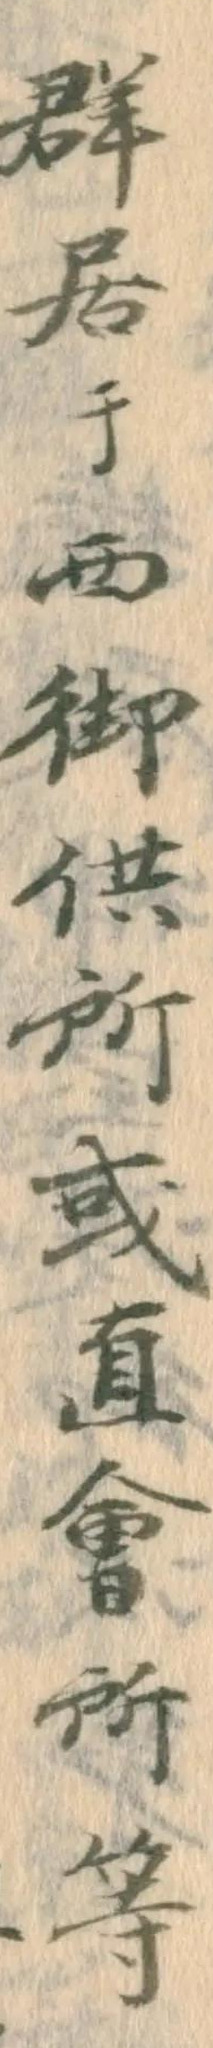群居于西御供所或直会所等
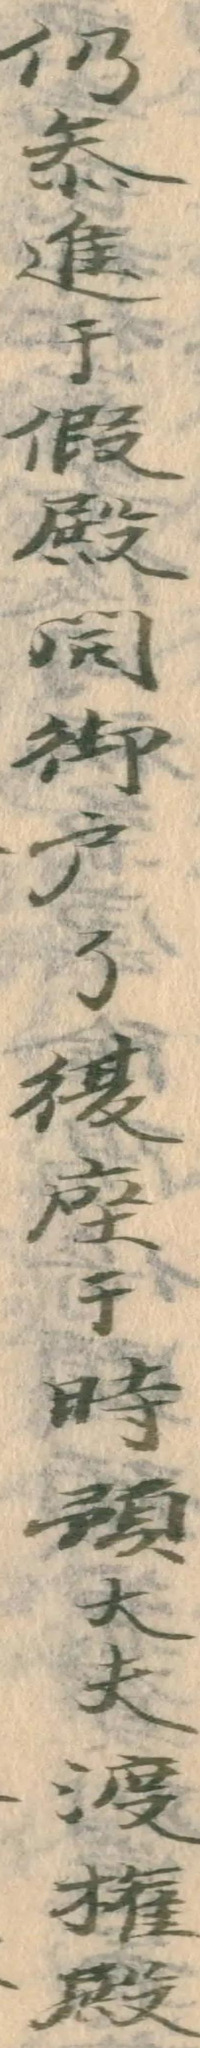仍参進于仮殿開御戸了復座于時預大夫渡権殿
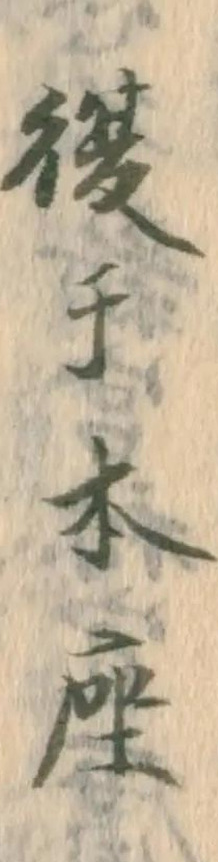復于本座
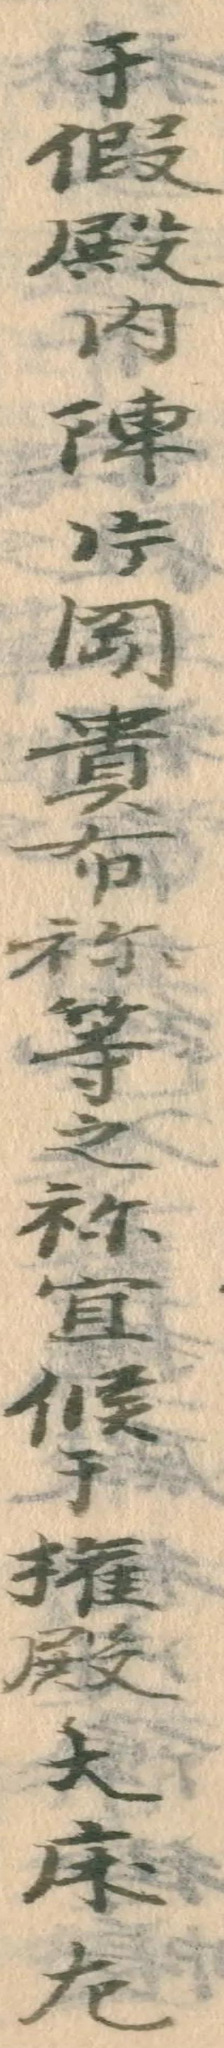手仮殿内陣片岡貴布祢等之祢宜候于権殿大床左
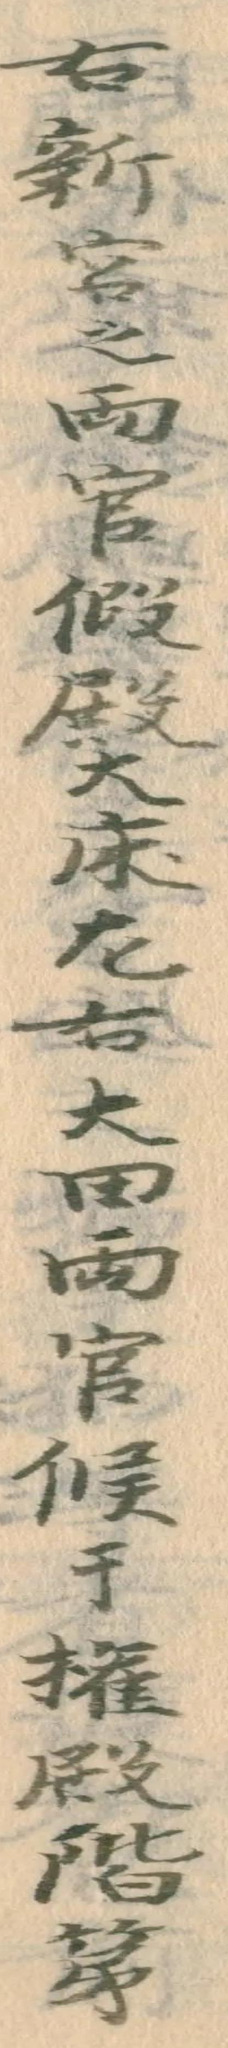右新宮之両官仮殿大床左右大田両官候于権殿階第
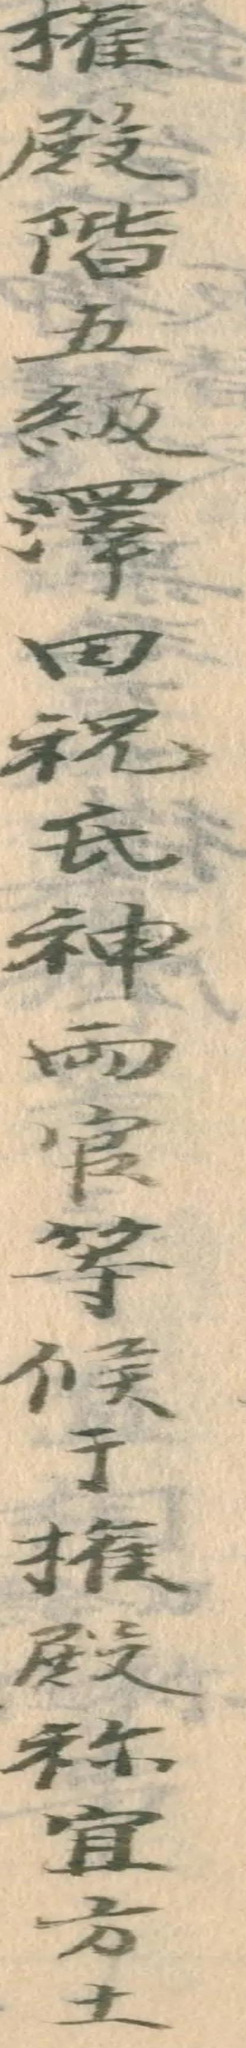権殿階五級沢田祝氏神両官等候于権殿祢宜方土
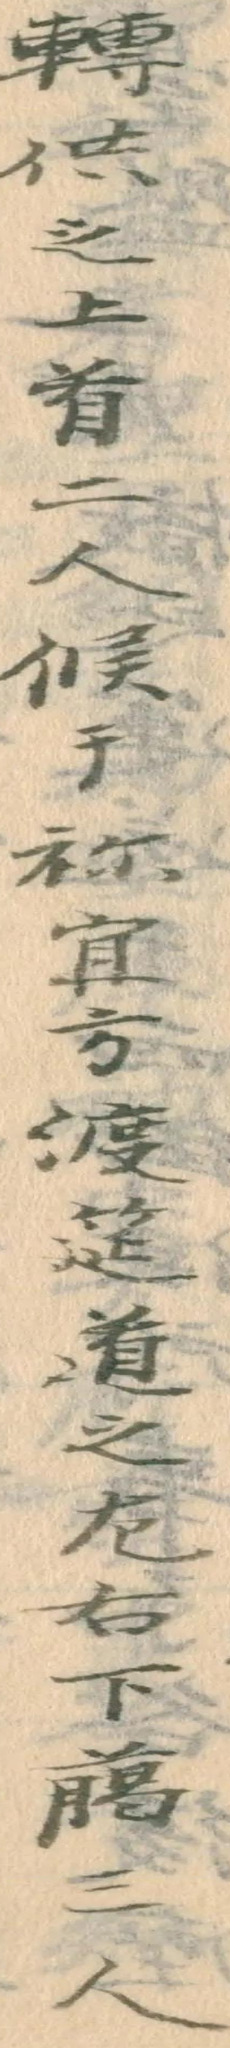転供之上首二人候于祢宜方渡筵道之左右下臈三人
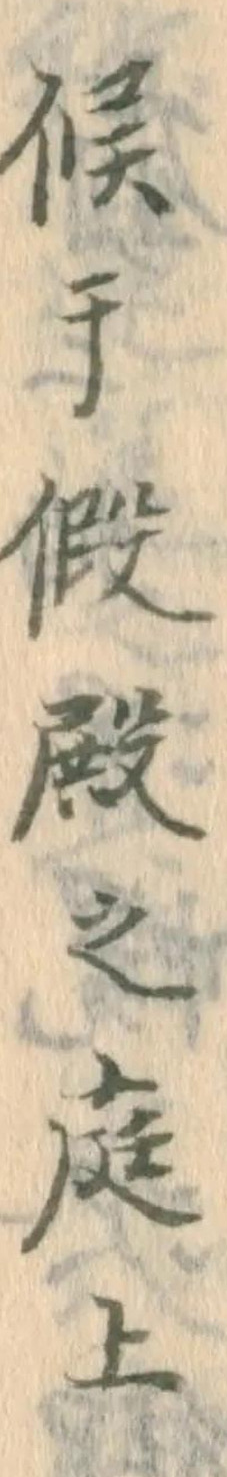候于仮殿之庭上
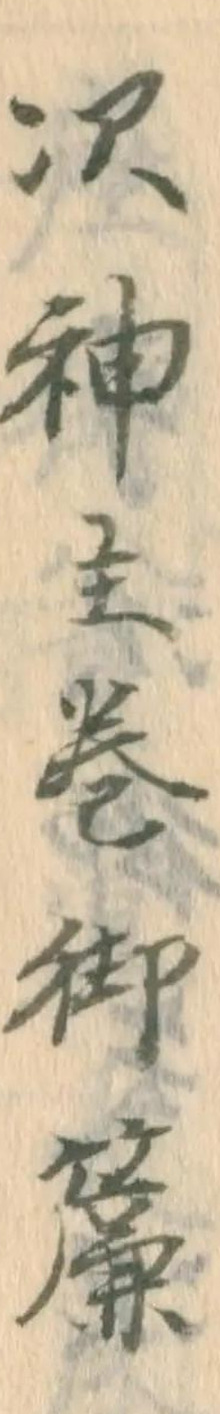次神主巻御簾
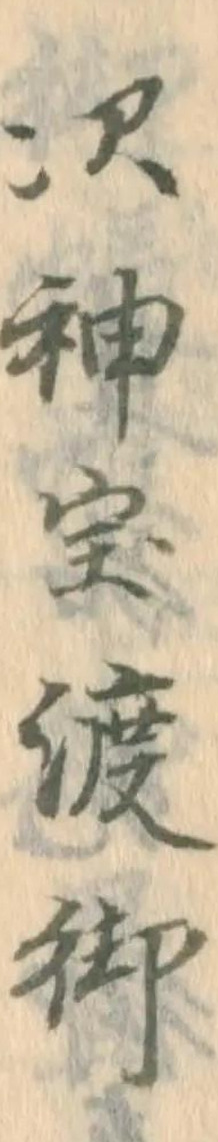次神宝渡御
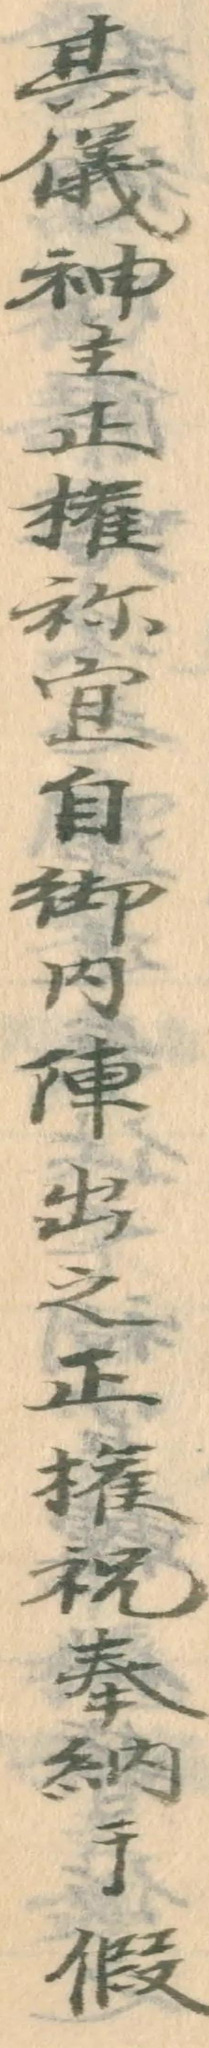其儀神主正権祢宜自御内陣出之正権祝奉納于仮

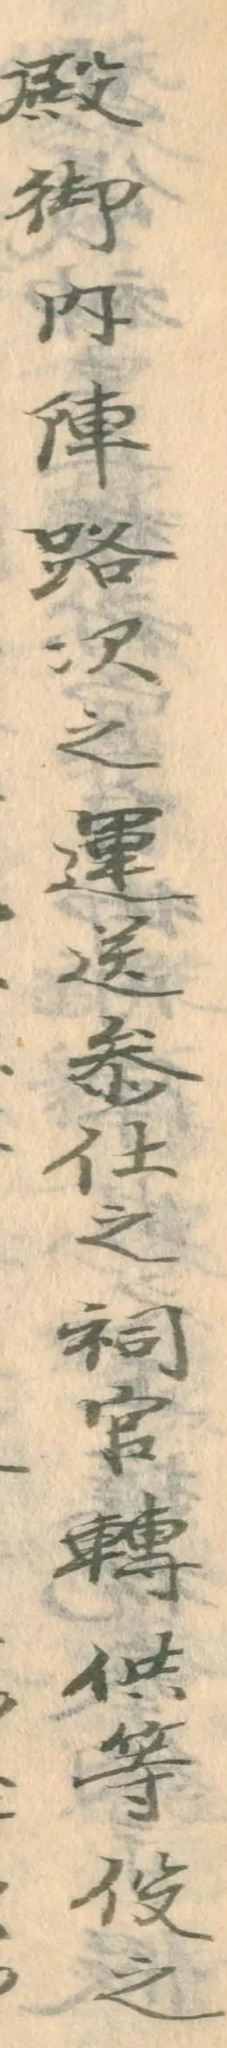殿御内陣路次之運送参仕之祠官転供等役之
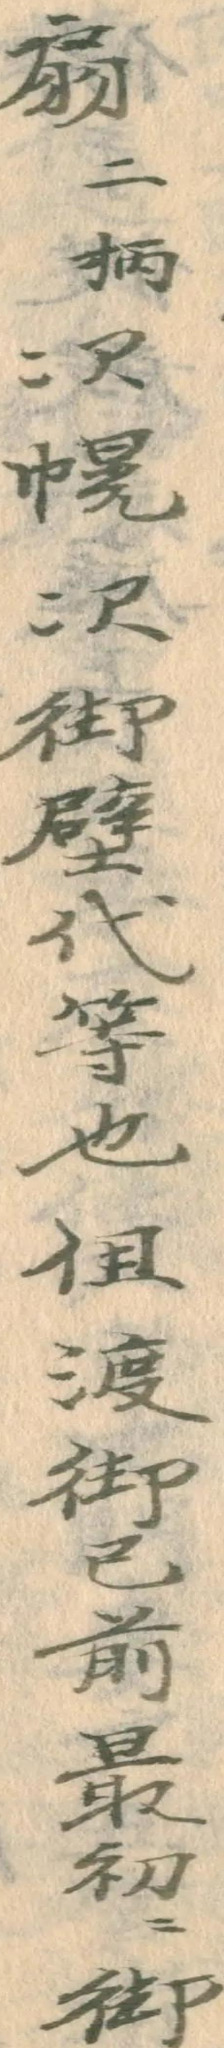扇二柄次幌次御壁代等也但渡御已前最初ニ御
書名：賀茂社記録. 第17冊
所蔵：国立国会図書館 National Diet Library, JAPAN
